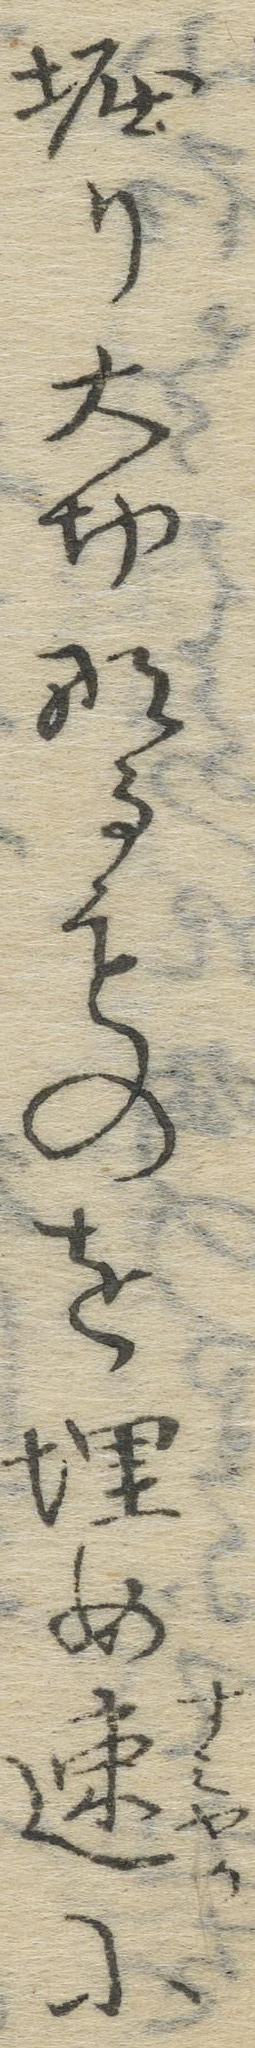掘り大切なるものを埋め速に
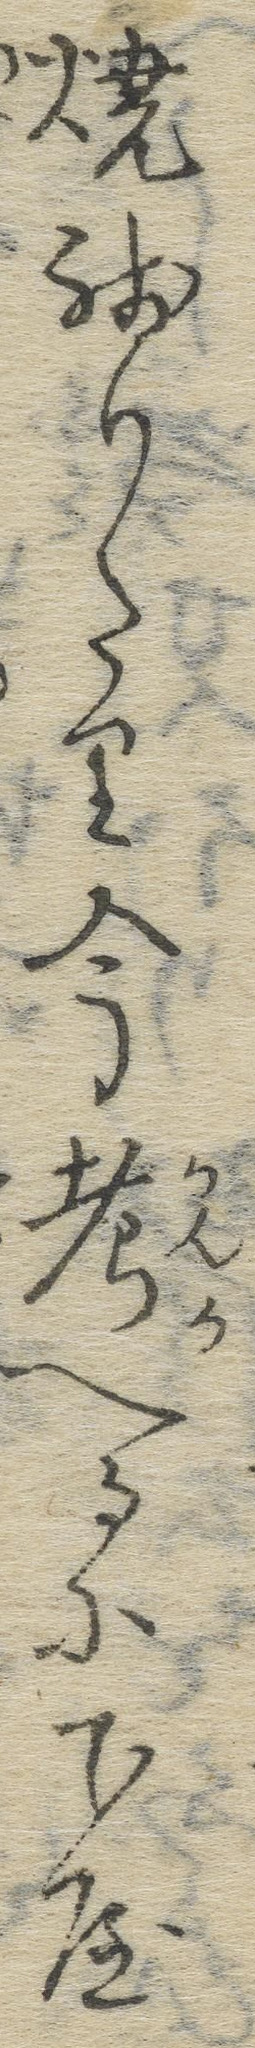焼残りたり今考へるに下屋
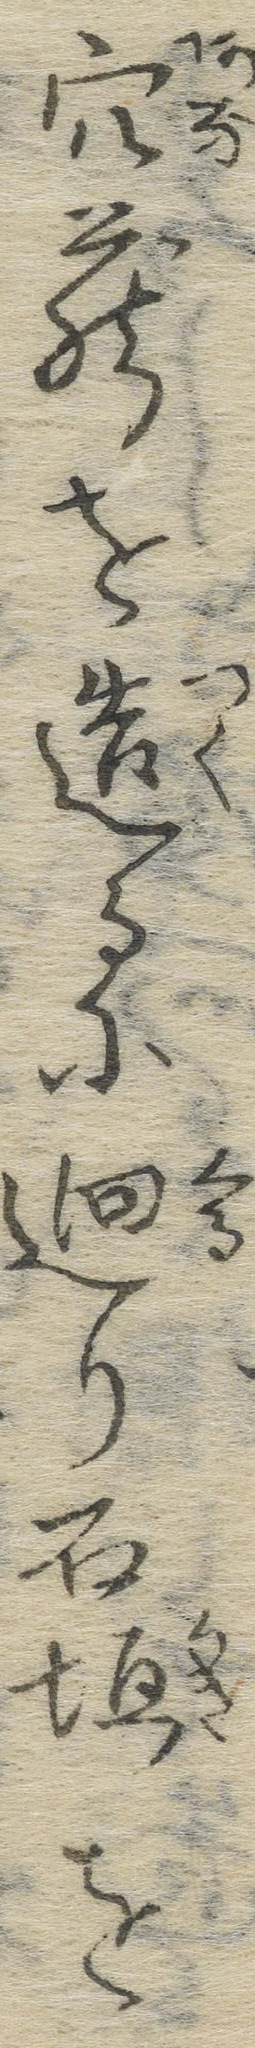穴蔵を造るに廻り石垣を
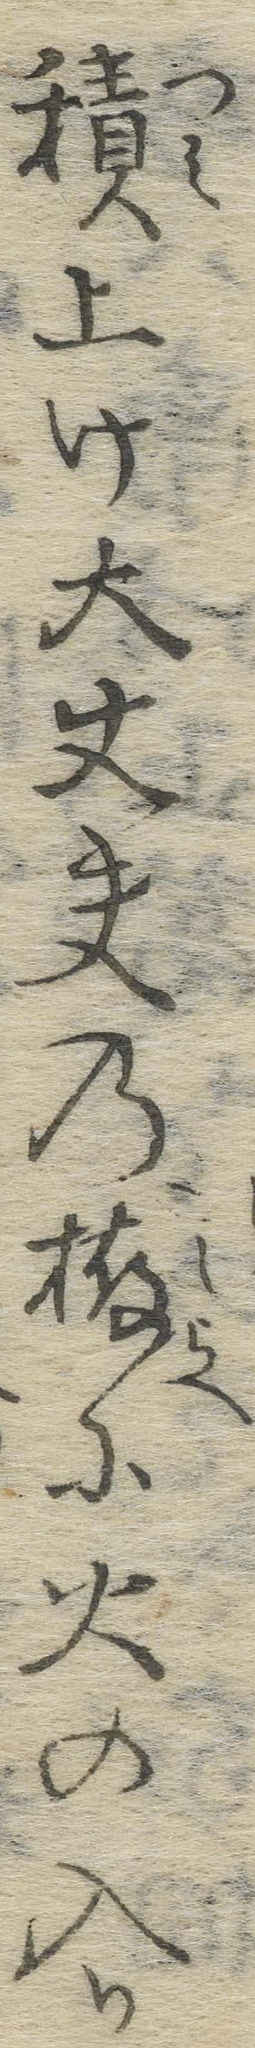積上げ大丈夫の拵に火の入り
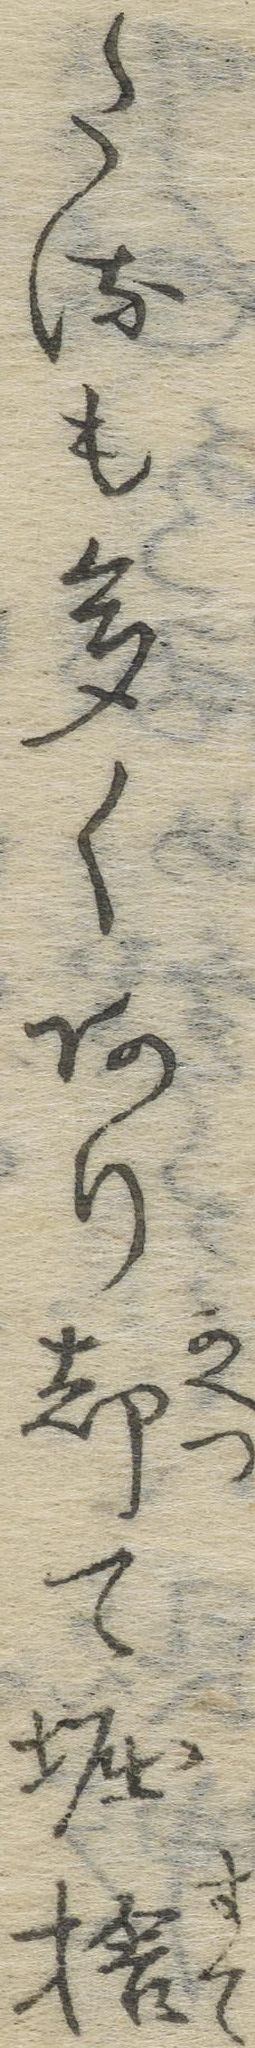たるも多くあり却て堀捨
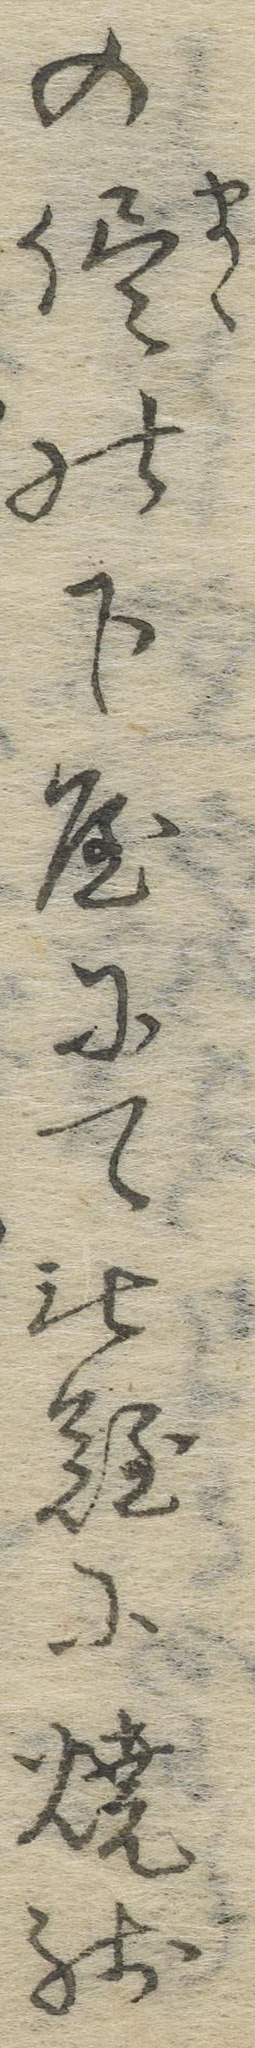の儘の下屋にて此難に焼残
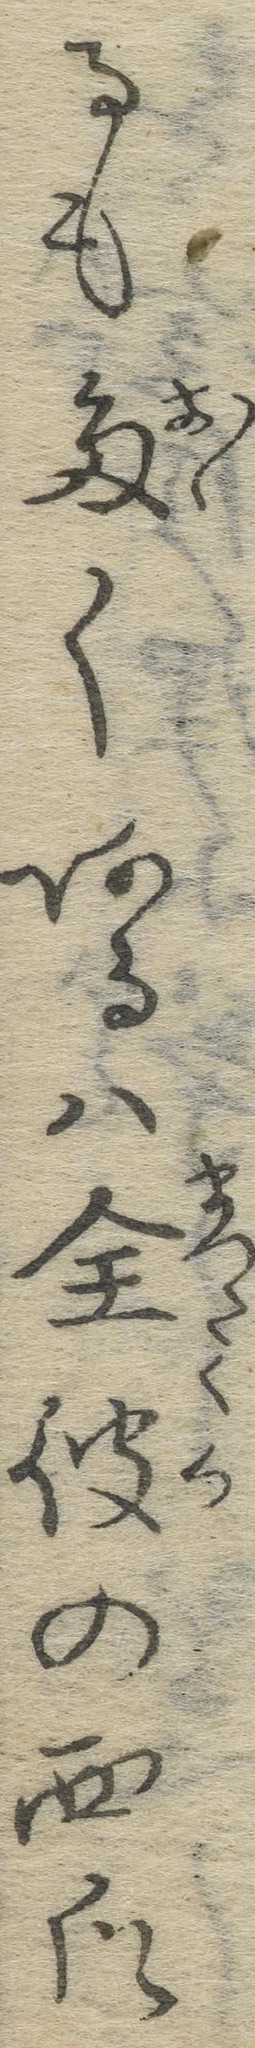るも多くあるは全彼の西瓜

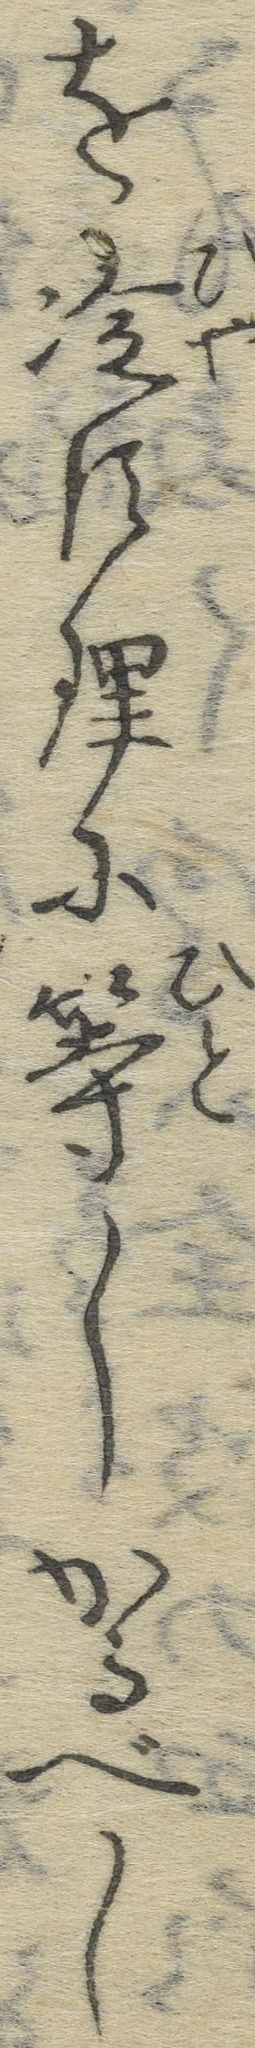を冷す理に等しかるべし
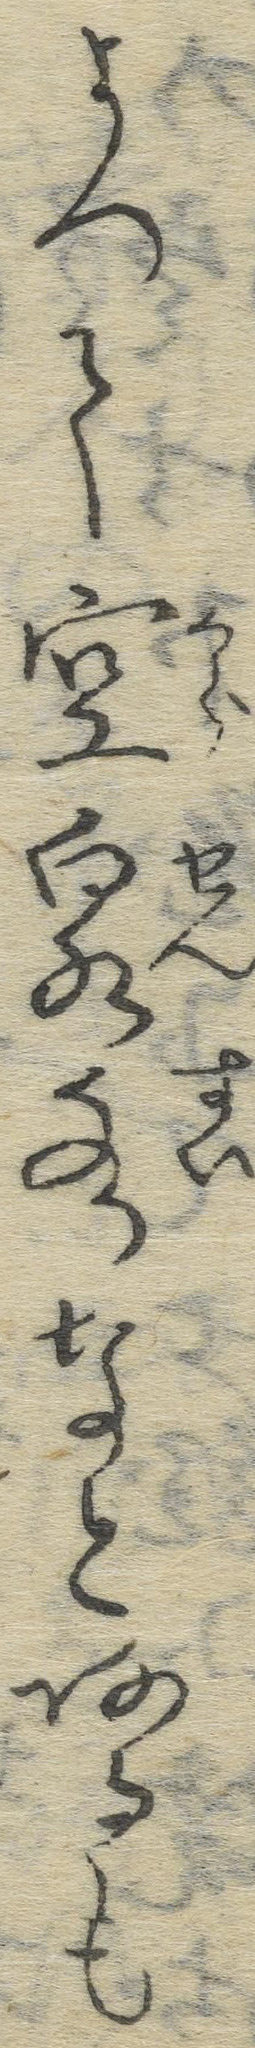よつて空泉水なとあるも
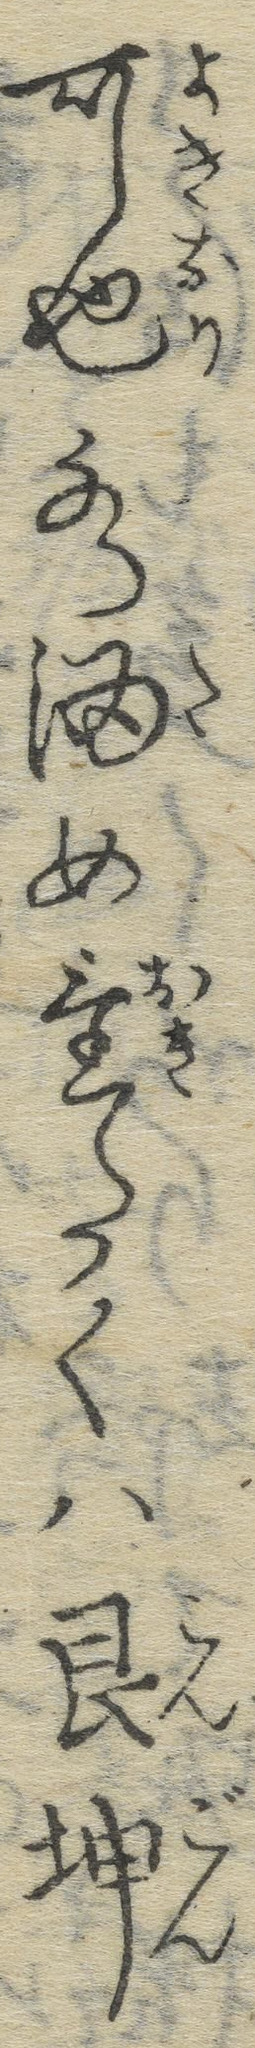可也水溜め置たくハ艮坤
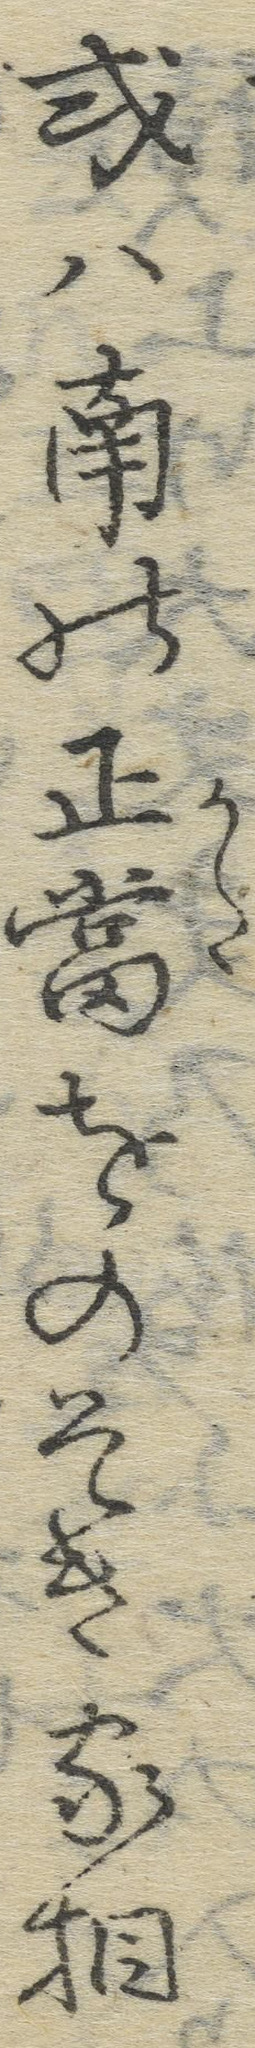或は南の正当をのそき家相
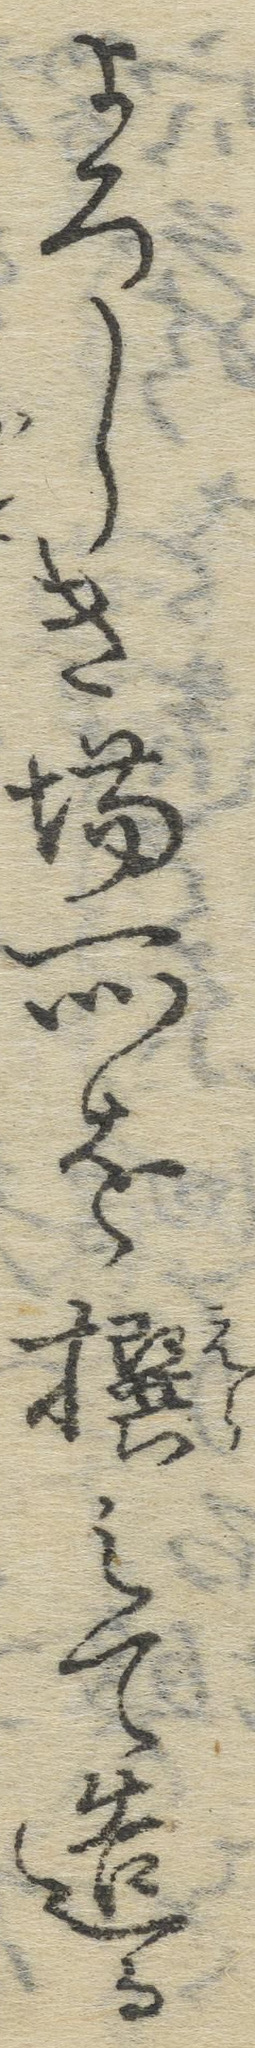よろしき場所を撰みて造る
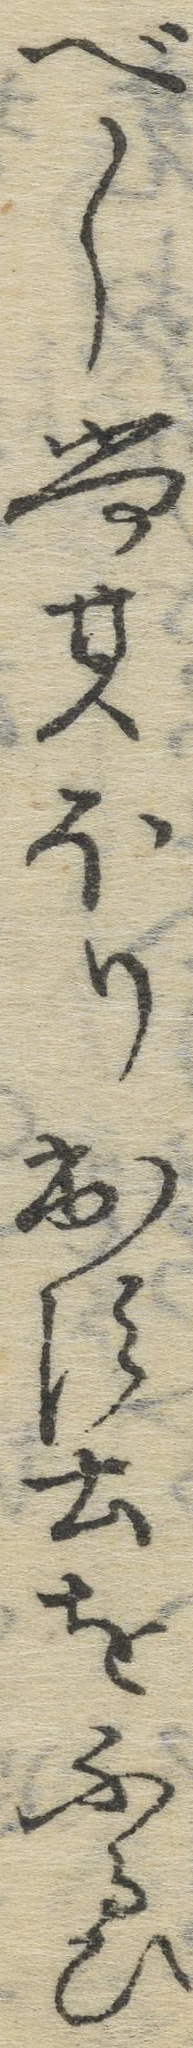べし尚其ほり出す土をふるひ
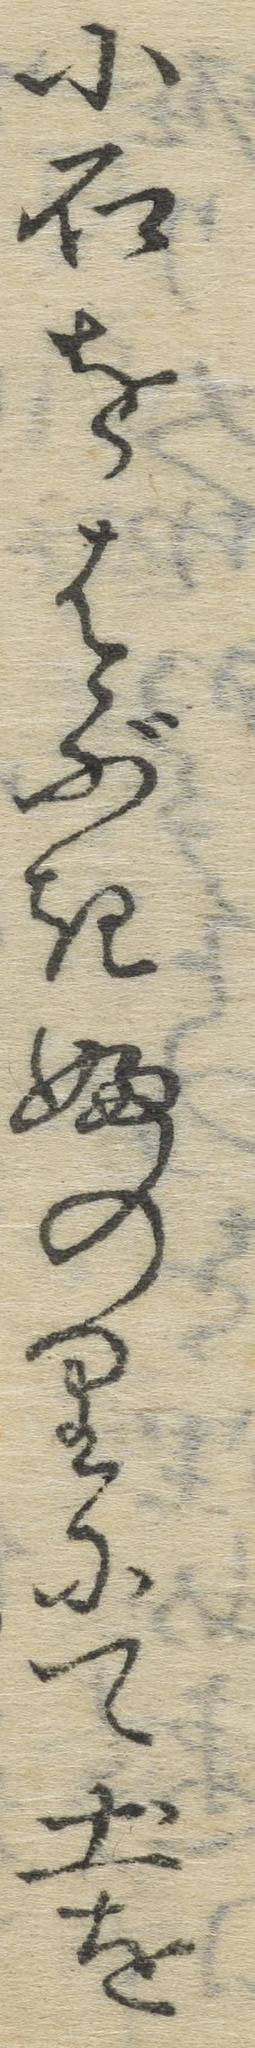小石をはぶきふのりにて土を
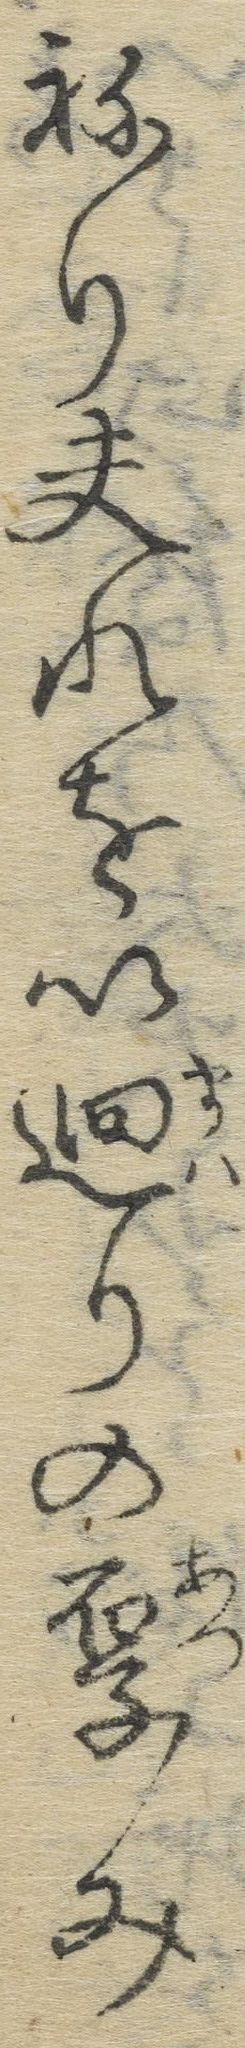ねり夫れを以廻りの厚み
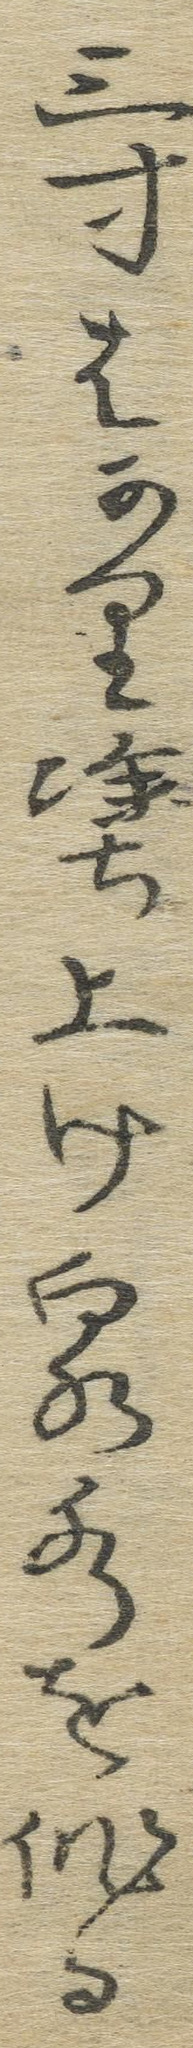三寸はかり塗上け泉水を作る
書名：あきの日照
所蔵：東京大学地震研究所図書室 Earthquake Research Institute Library, The University of Tokyo, JAPAN
